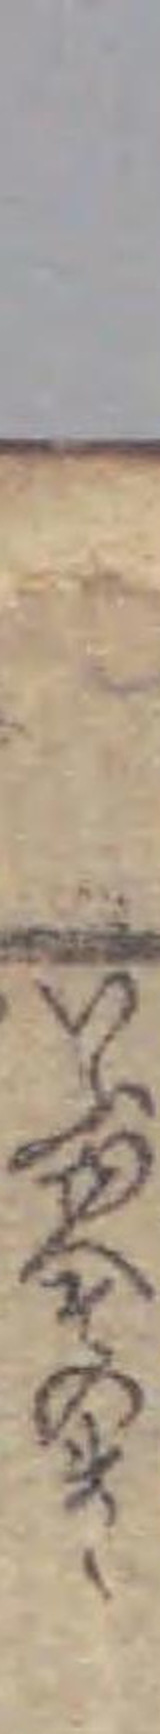いふゆへそのまゝ
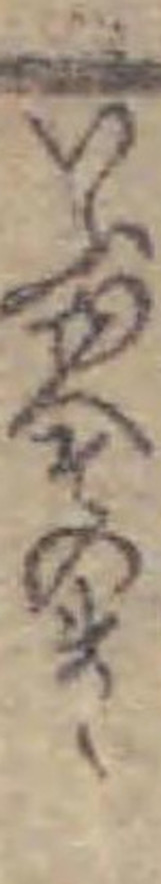いふゆへそのまゝ
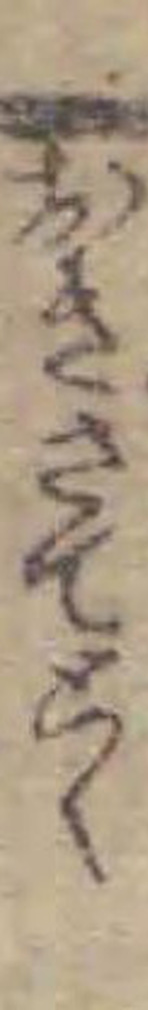おきさてとく
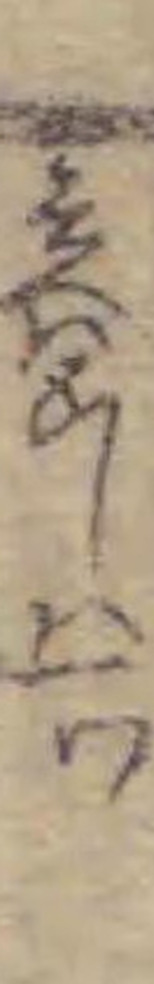兵へはとしは一つ
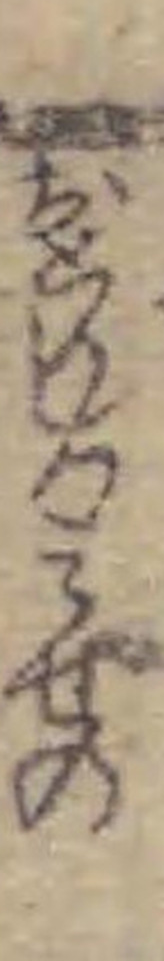おとりしかみせの
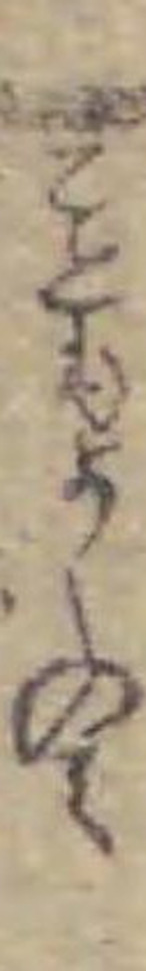こともよくのみ
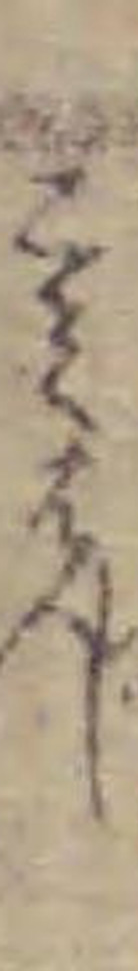こみはんじ
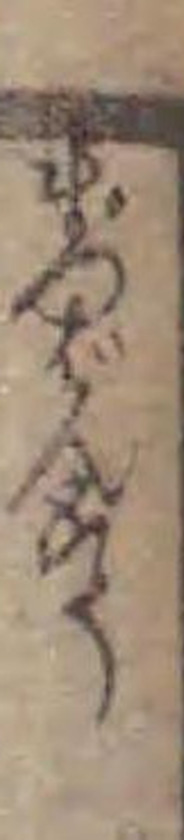まづばんとう
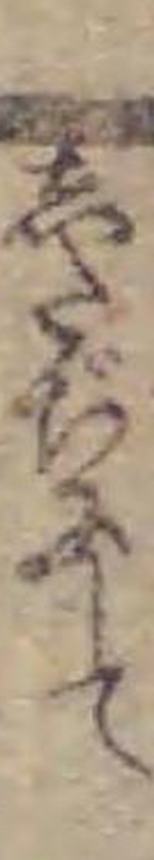したぢにして
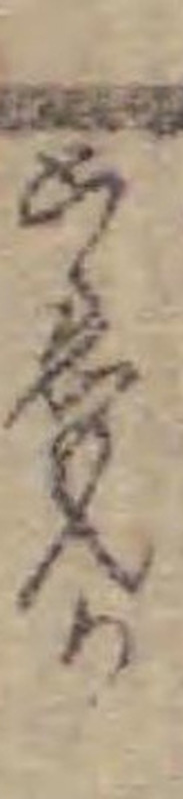とくゑもんか
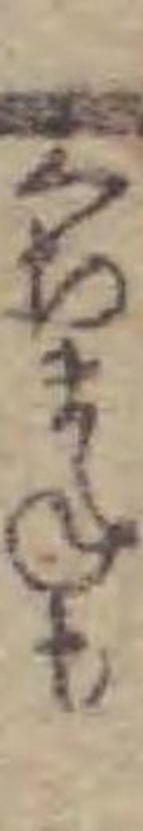くちまねも
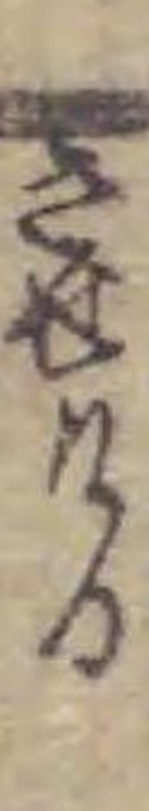させける
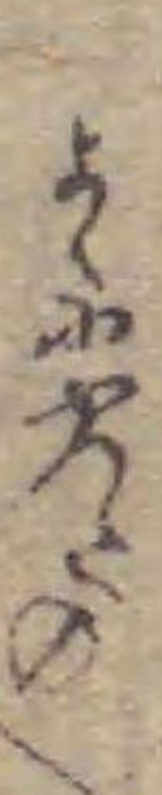よくにやつたの
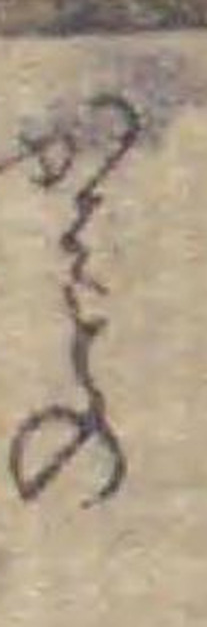かみとの
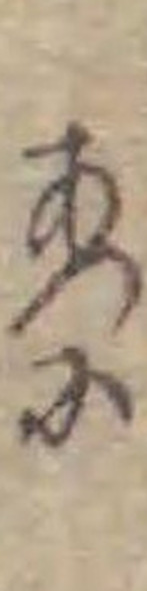あつに
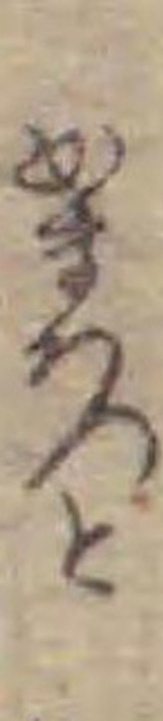かまはつと
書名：通風伊勢物語 : 3巻
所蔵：国立国会図書館 National Diet Library, JAPAN
